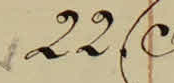22.
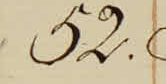52.
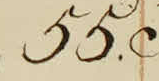55.
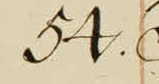54.
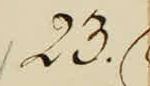23.
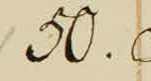50.
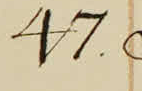47.
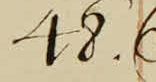48.
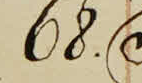68.
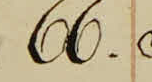66.
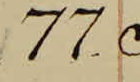77.
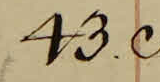43.
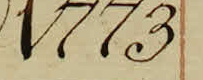1773
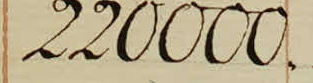220000
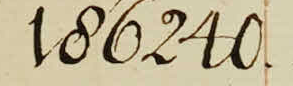186240
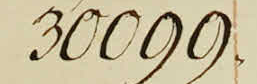30099
